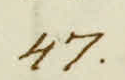47
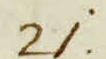21
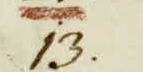13.
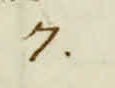7.
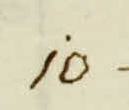10
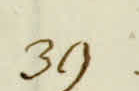39
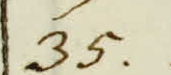35.
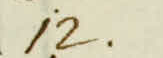12.
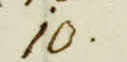10
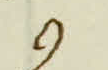9
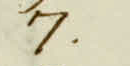7.
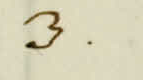3.
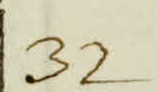32
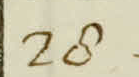28
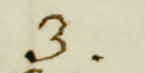3.
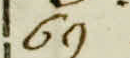69
